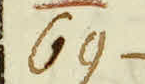69
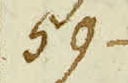59
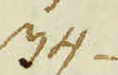34
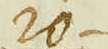20
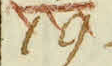19
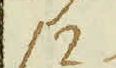12
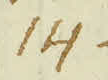14
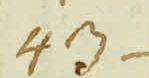43
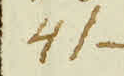41
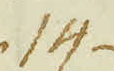14
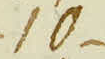10
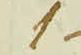1
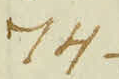74
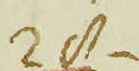28
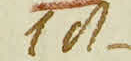18
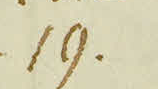19.
